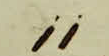11
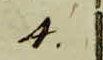4.
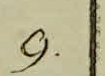9.
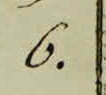6.
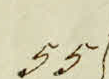55
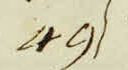49
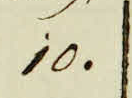10.
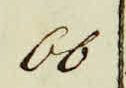66
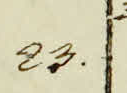23.
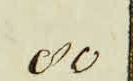80
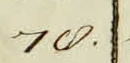78.
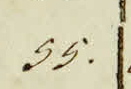55.
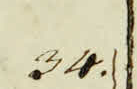34.
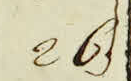26
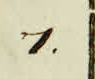7.
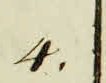4.
